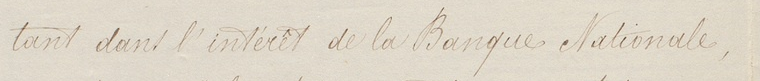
tant dans l'intérêt de la Banque Nationale,
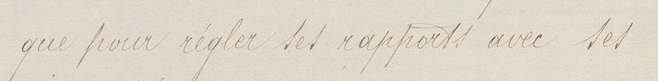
que pour régler ses rapports avec ses
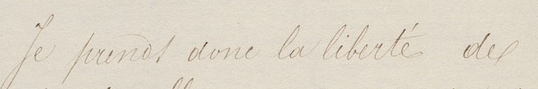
Je prends donc la liberté de
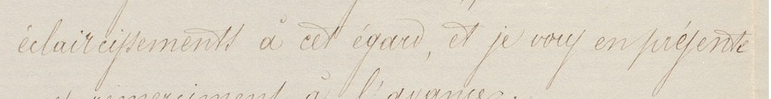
éclaircissements à cet égard, et je vous en présente
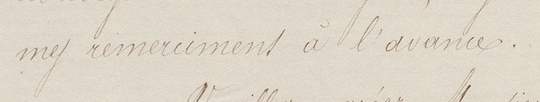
mes remercimens à l'avance.
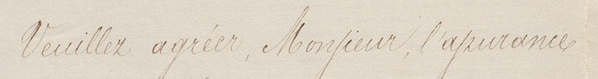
Veuillez agréer, Monsieur, l'assurance
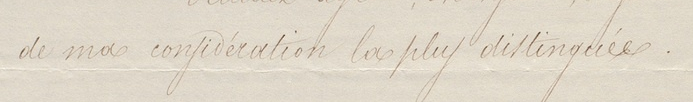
de ma considération la plus distinguée.
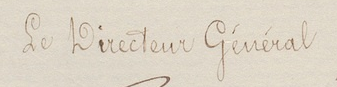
Le Directeur Général
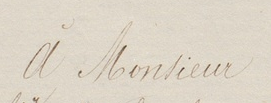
À Monsieur
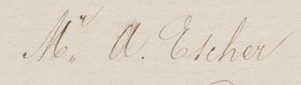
Mr A. Escher
